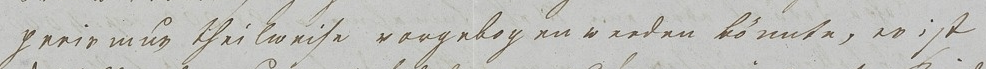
perismus theilweise vorgebogen werden könnte, es ist
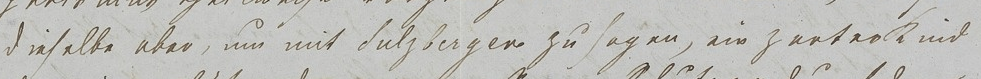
dieselbe aber, um mit Sulzberger zu sagen, ein zartes Kind
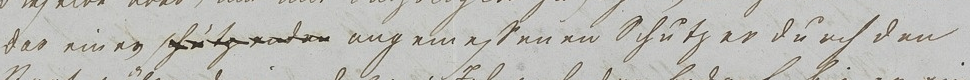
das eines schützenden angemessenen Schutzes durch den
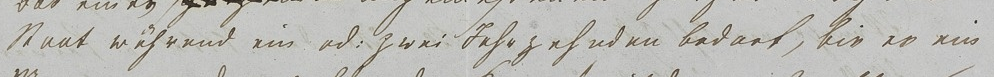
Staat während ein od: zwei Jahrzehnden bedarf, bis es ein
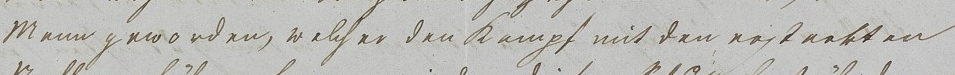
Mann geworden, welcher den Kampf mit den erstarkten
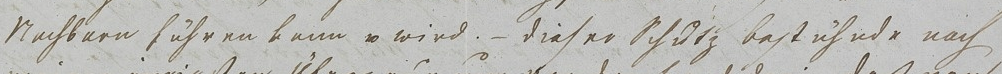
Nachbarn führen kann & wird. – Dieser Schutz bestühnde nach
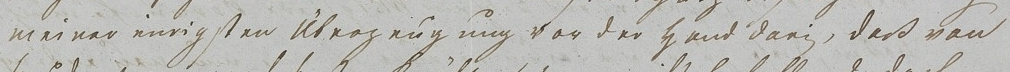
meiner innigsten Überzeugung vor der Hand darin, daß von
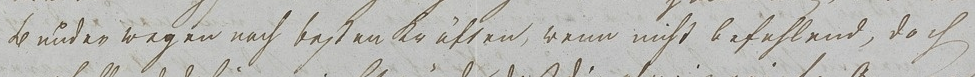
Bundes wegen nach besten Kräften, wenn nicht befehlend, doch
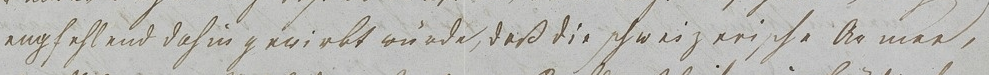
empfehlend dahin gewirkt würde, daß die schweizerische Armee,
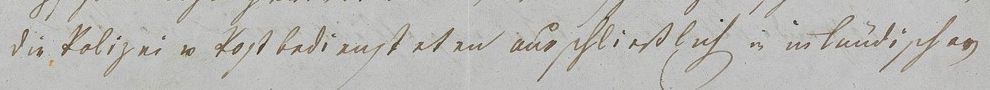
die Polizei & Postbediensteten ausschließlich in inländisches
